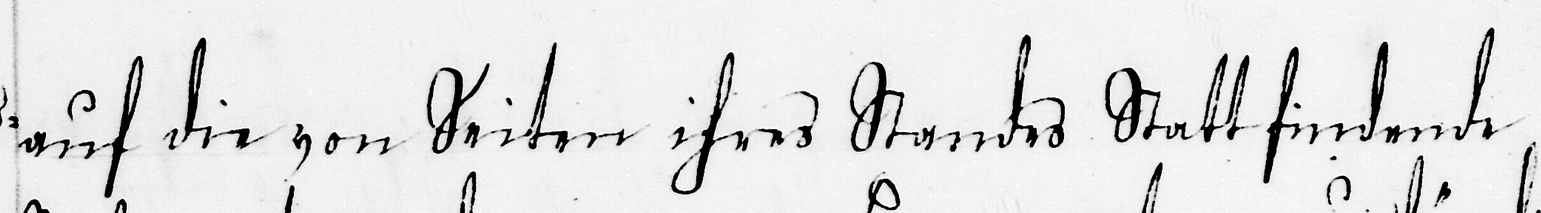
auf die von Seiten ihres Standes Statt findende
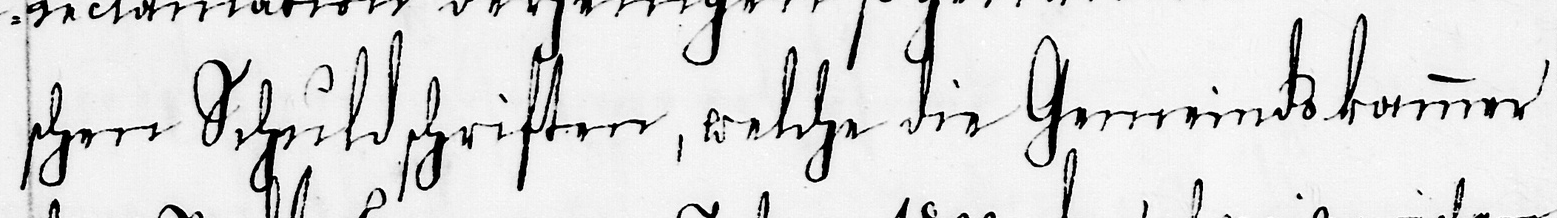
schen Schuldschriften, welche die Gemeindskammer
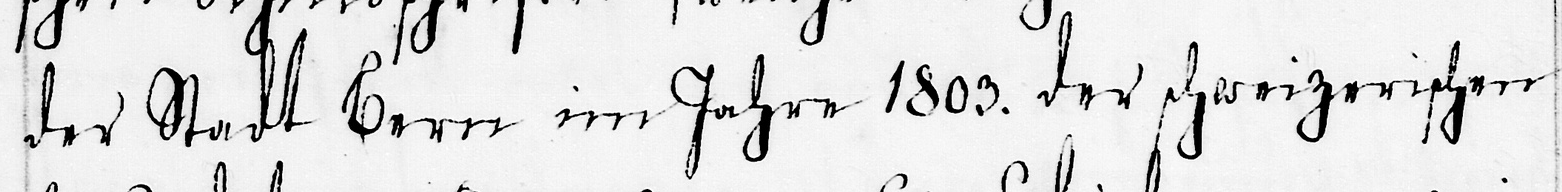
der Stadt Bern im Jahre 1803. der schweizerischen
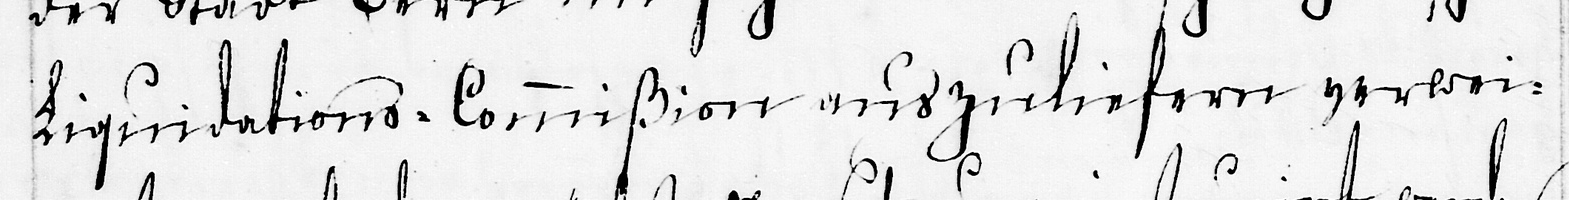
Liquidations-Commißion auszuliefern verwei¬
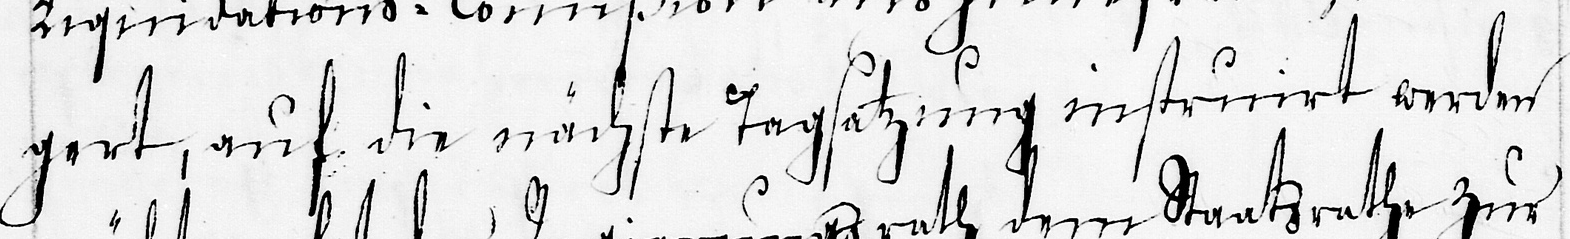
gert, auf die nächste Tagsatzung instruirt werden
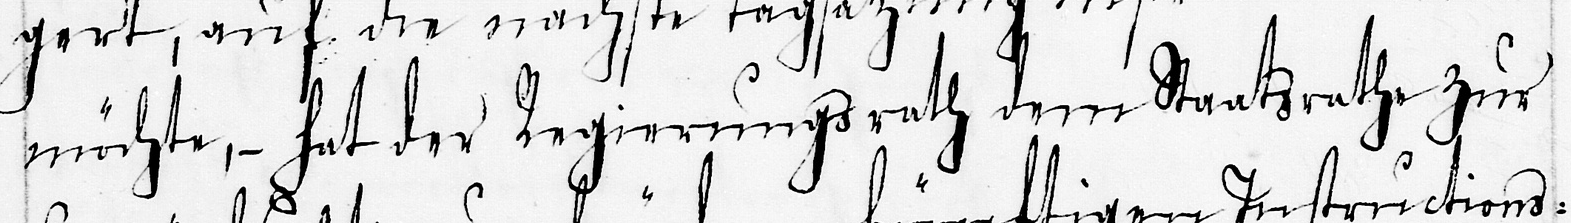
möchte, – hat der Regierungsrath dem Staatsrathe zur
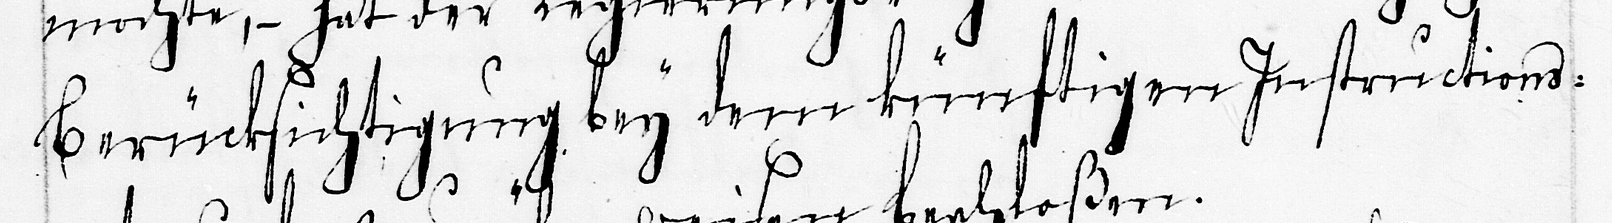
Berücksichtigung bey dem künftigen Instructions¬
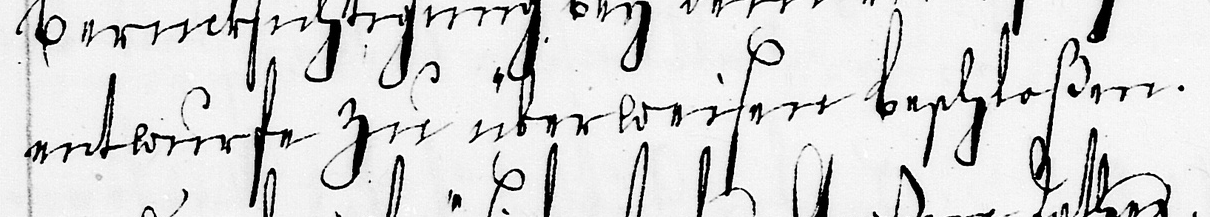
entwurfe zu überweisen beschloßen.
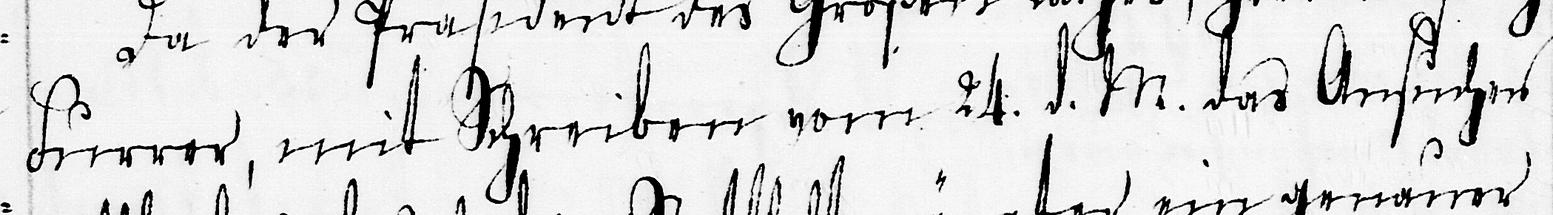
Furrer, mit Schreiben vom 24. d. M. das Ansuchen
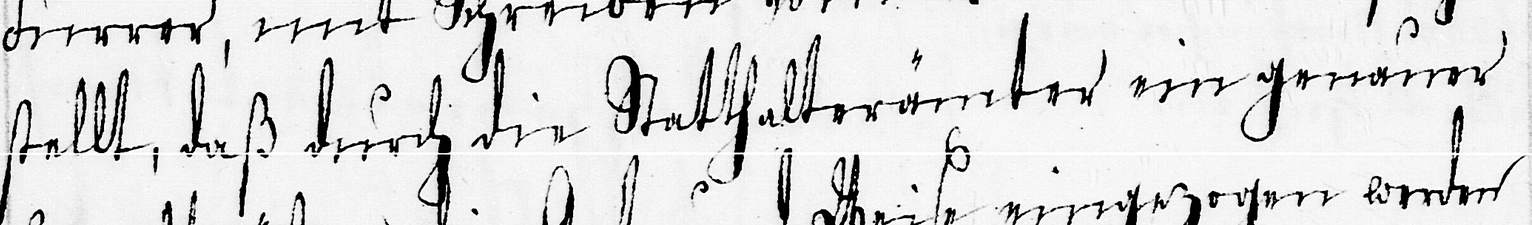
stellt, daß durch die Statthalterämter ein genauer
